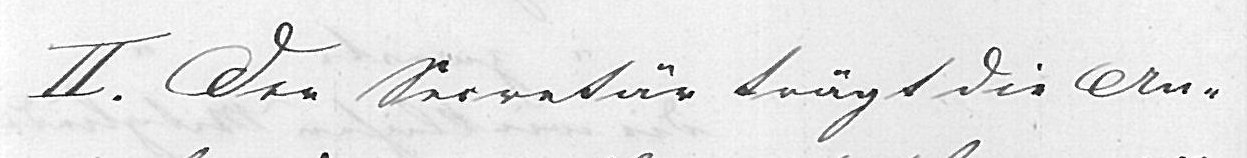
II.Der Secretär trägt die An-
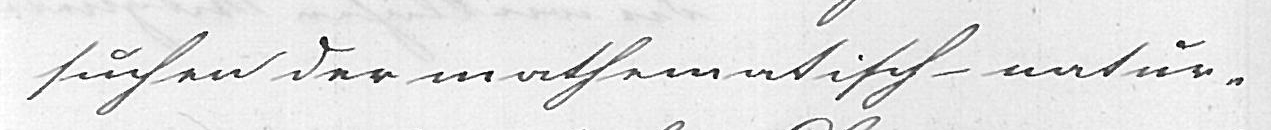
suchen der mathematisch-natur-
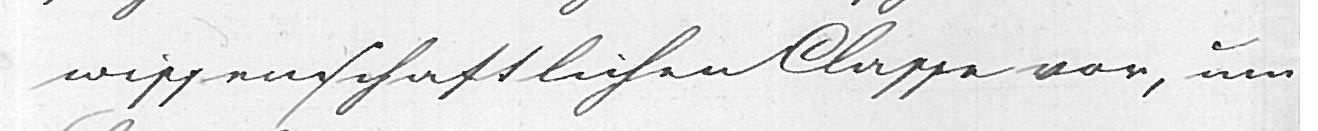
wissenschaftlichen Classe vor, um
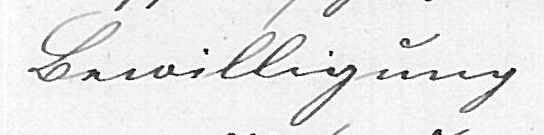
Bewilligung
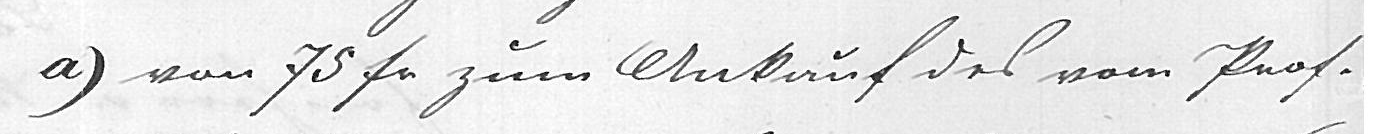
a) von 75 fl zum Ankauf des vom Prof.
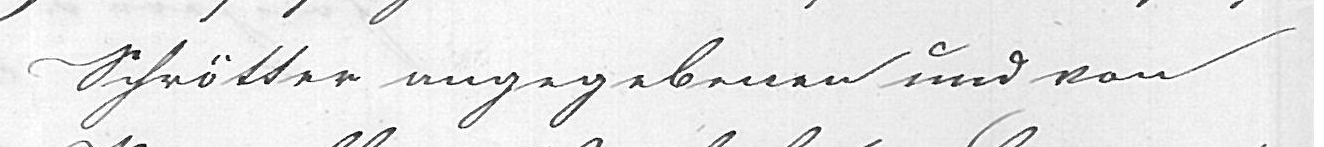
Schrötter angegebenen und von
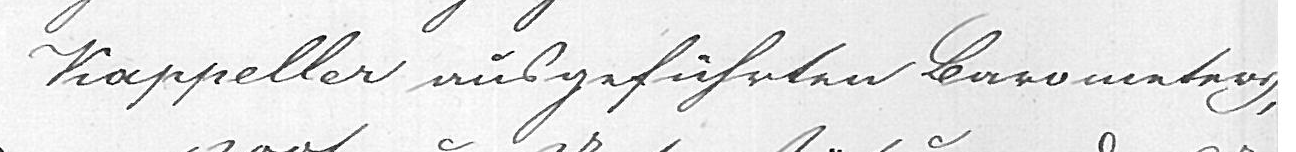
Kappeller ausgefährten Barometers,
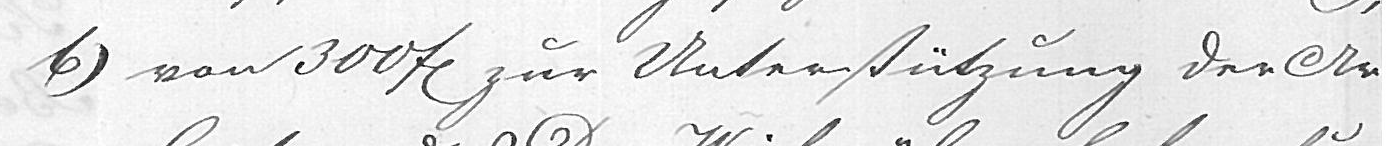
b) von 300 fl zur Unterstützung der Ar-
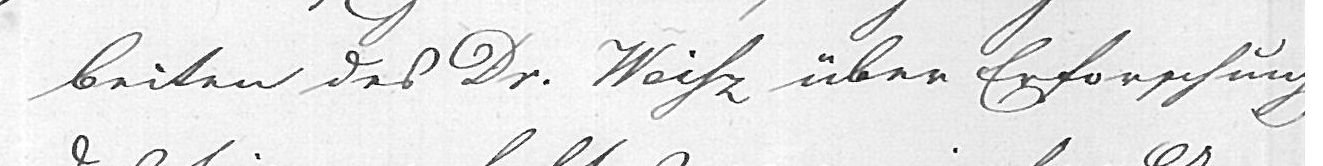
beiten des Dr. Weisz über Erforschung
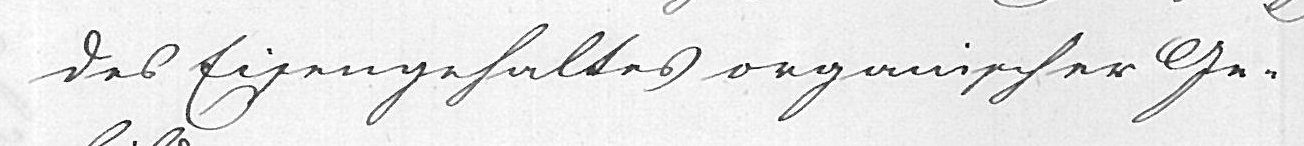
des Eisengehaltes organischer Ge-
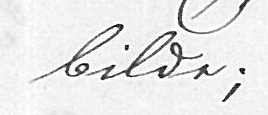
bilde;
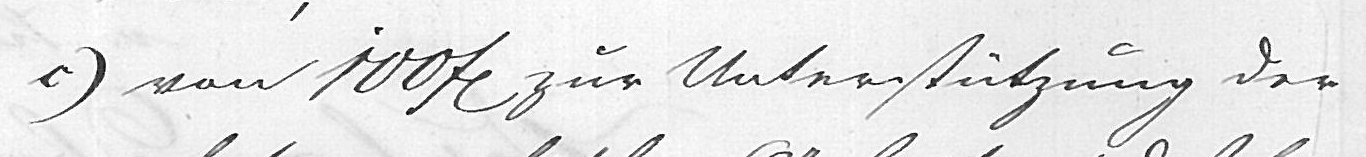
c) von 100 fl zur Unterstützung der
